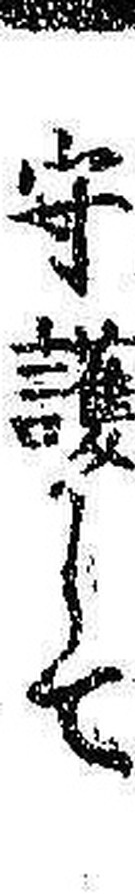守護して
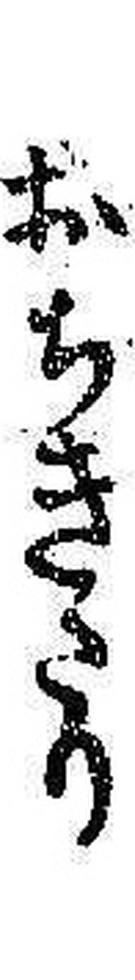おちきたり
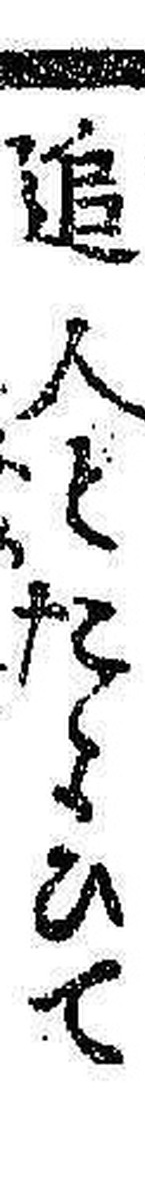追人とたゝかひて
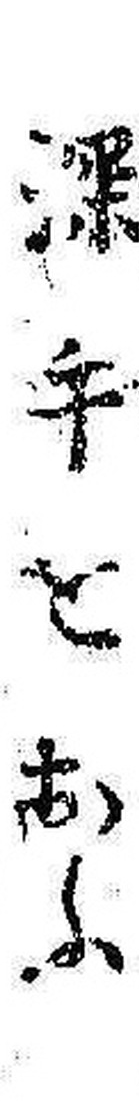深手をおふ

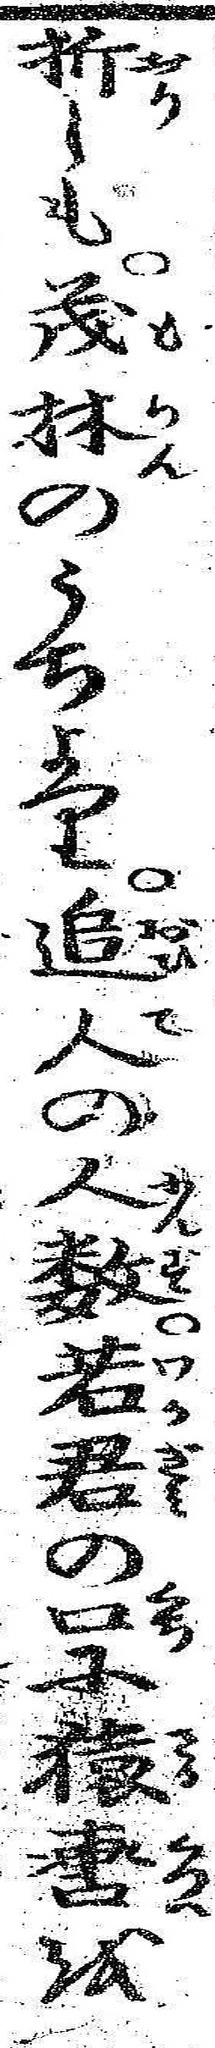折しも。茂林のうちより。追人の人数。若君の口に猿轡を
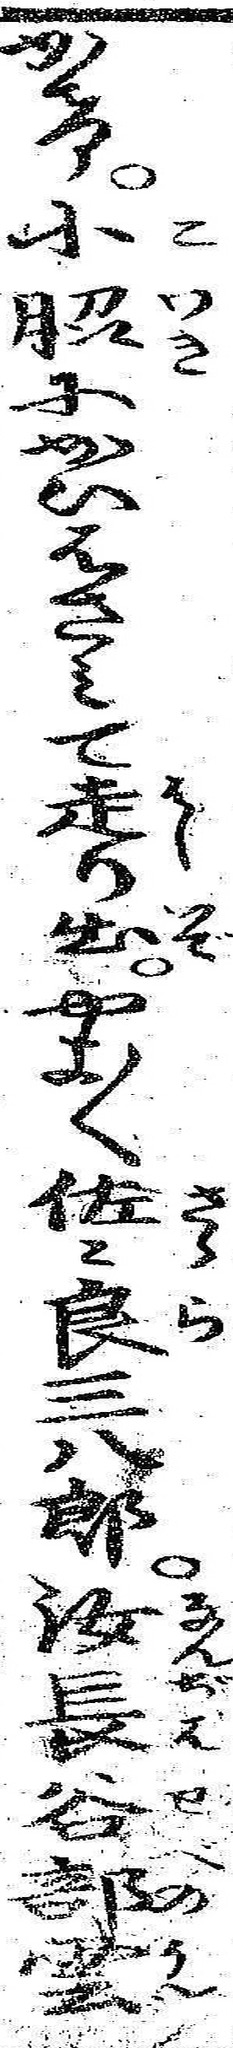かけ。小脇にかいはさみて走り出。やよ〳〵佐々良三八郎。汝長谷部雲
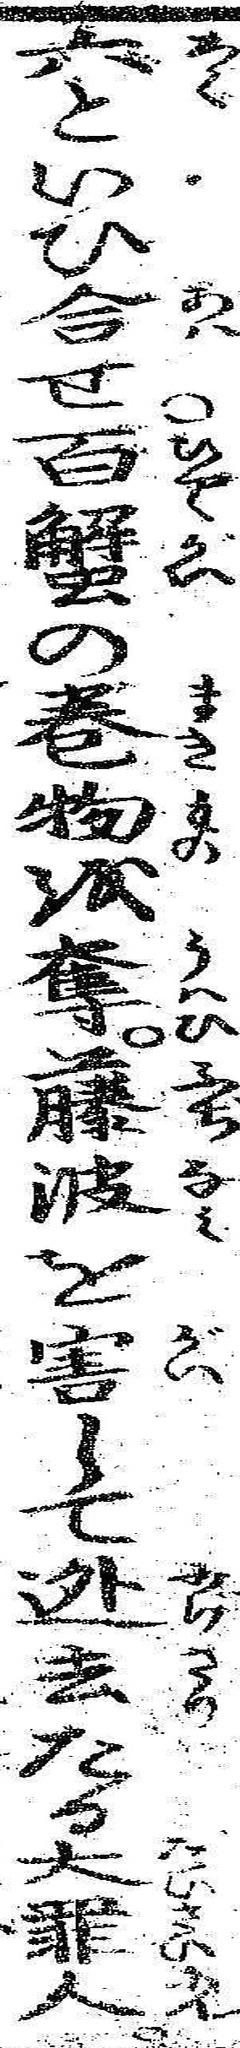六といひ合せ。百蟹の巻物を奪。藤波を害して逃去たる大罪人
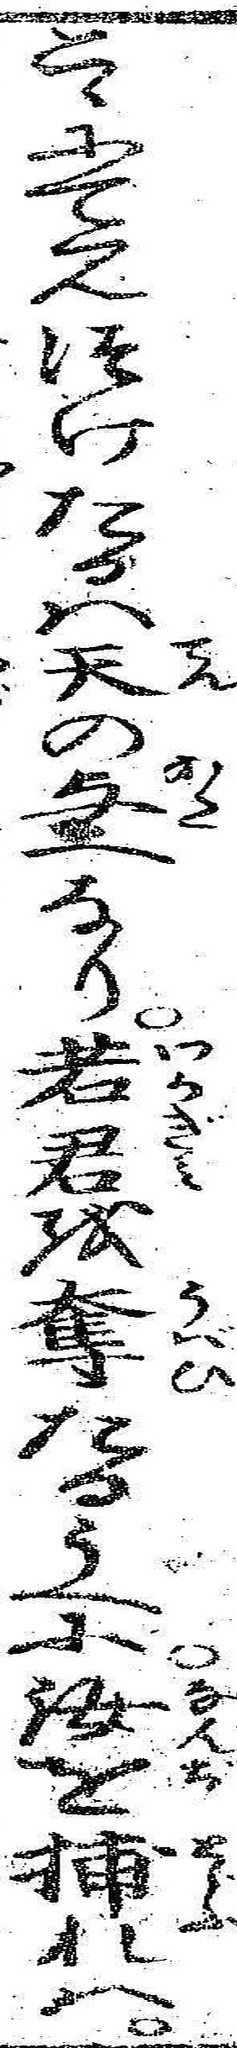こゝにて見つけたるは天の与へなり。若君を奪たるうへに。汝を捕れは。
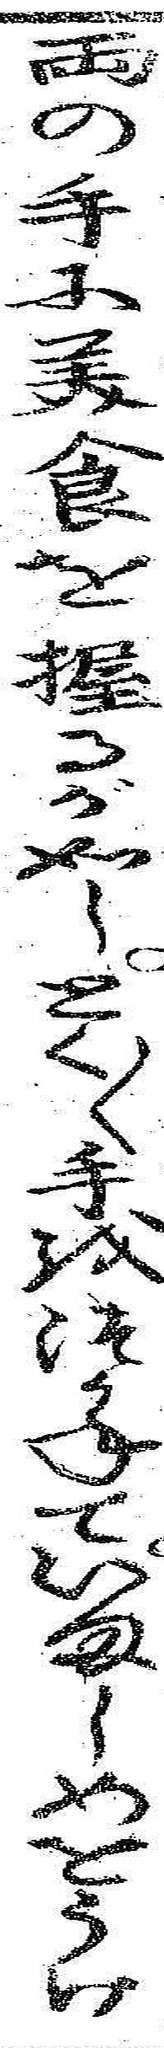両の手に美食を握るが如し。とく〳〵手をつかねて。いましめをうけ
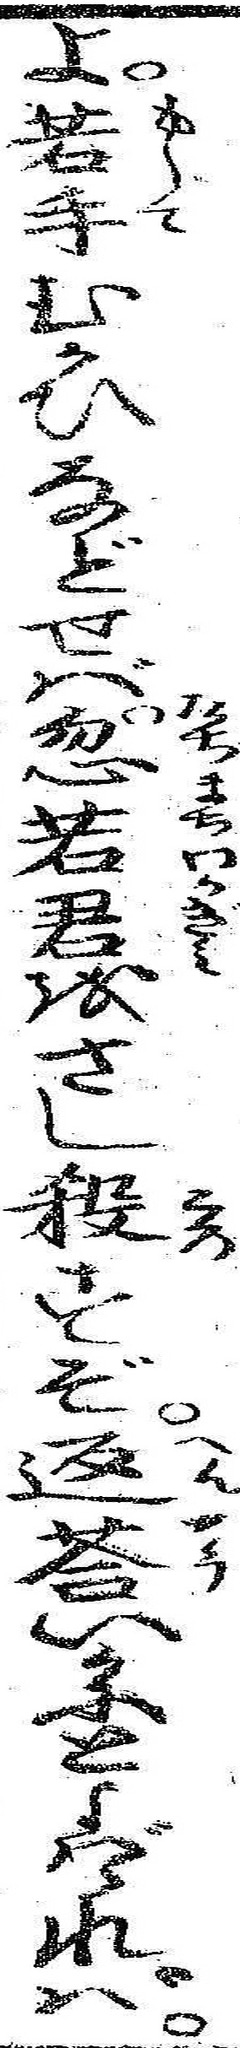よ。若手むかひなどせば。忽若君をさし殺すぞ。返荅いかにとよばゝれば。
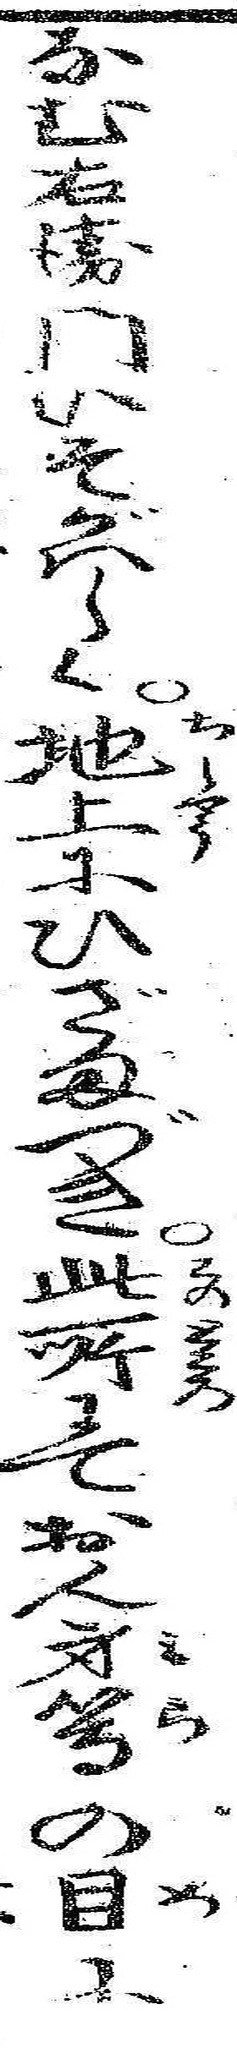なむ右衛門いそがはしく。地上にひざまづき。此所にておん身等の目に
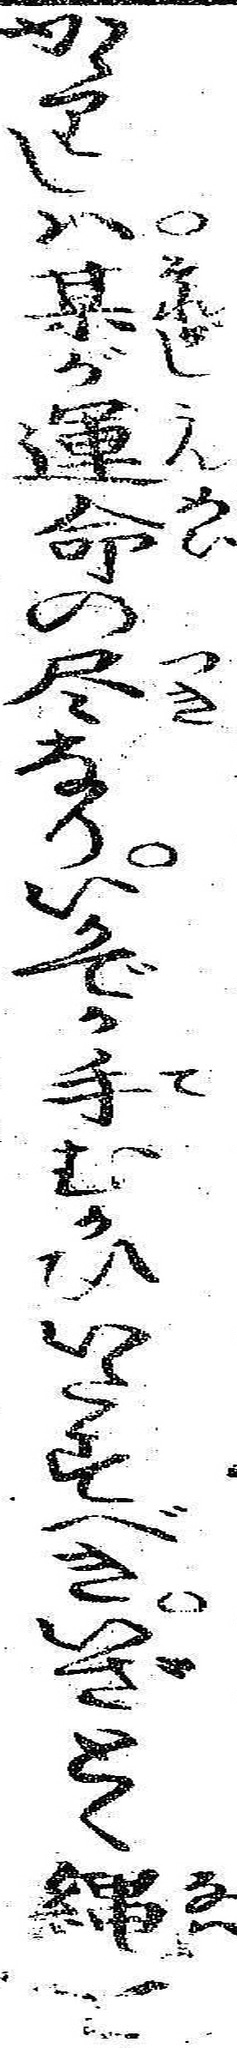かゝりしは。某が運命の尽なり。いかでか手むかひいたすべき。いざとく縄を
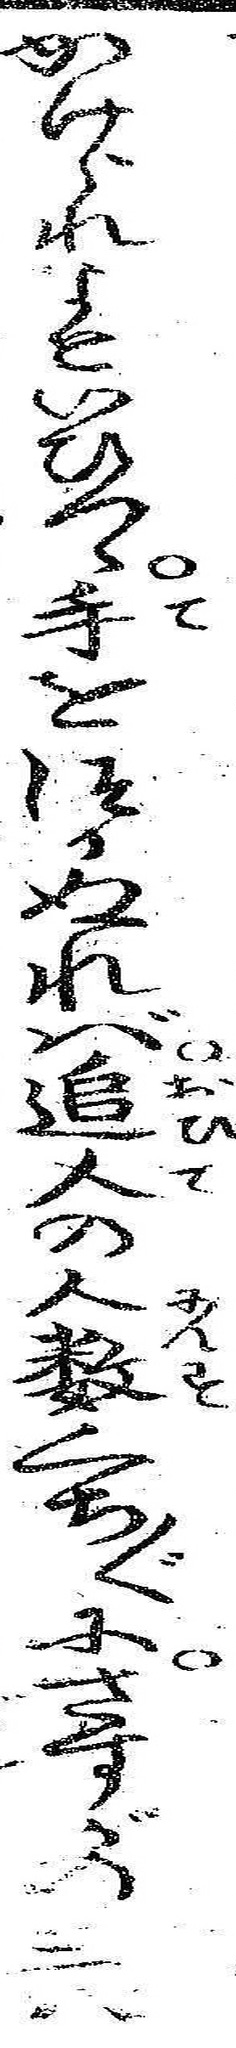かけられよといひつゝ。手をつかぬれば。追人の人数くち〴〵に。さすがの三八
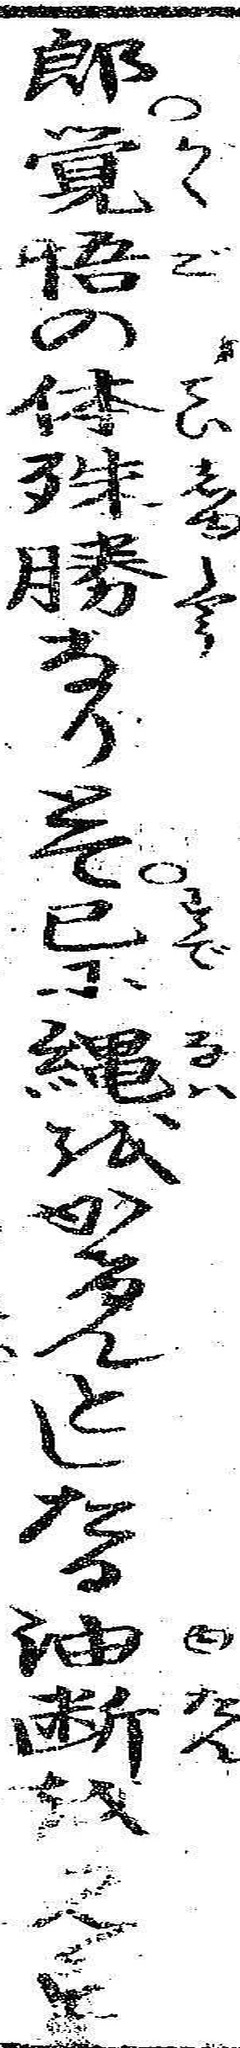郎。覚悟の体殊勝なりとて。已に縄をかけんとしたる油断を見す
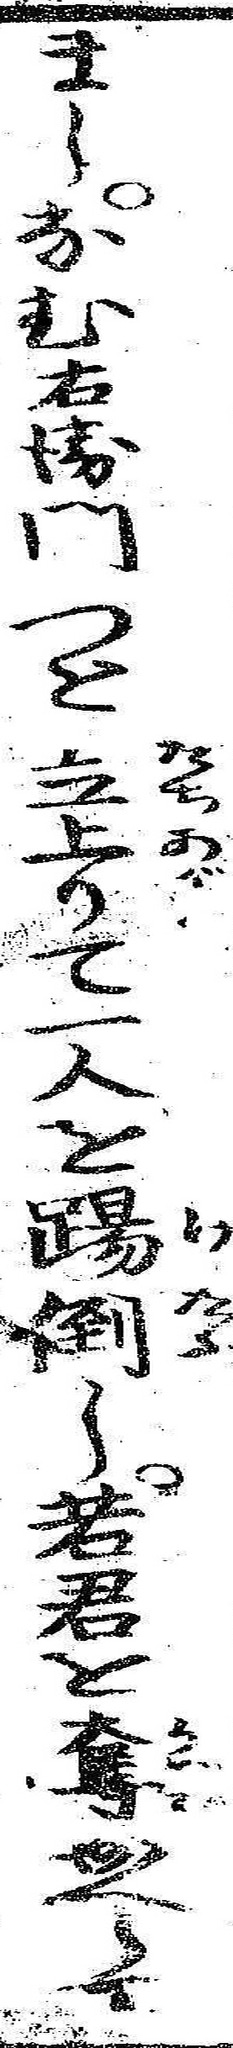まし。なむ右衛門つと立上りて一人を踢倒し。若君を奪かへして
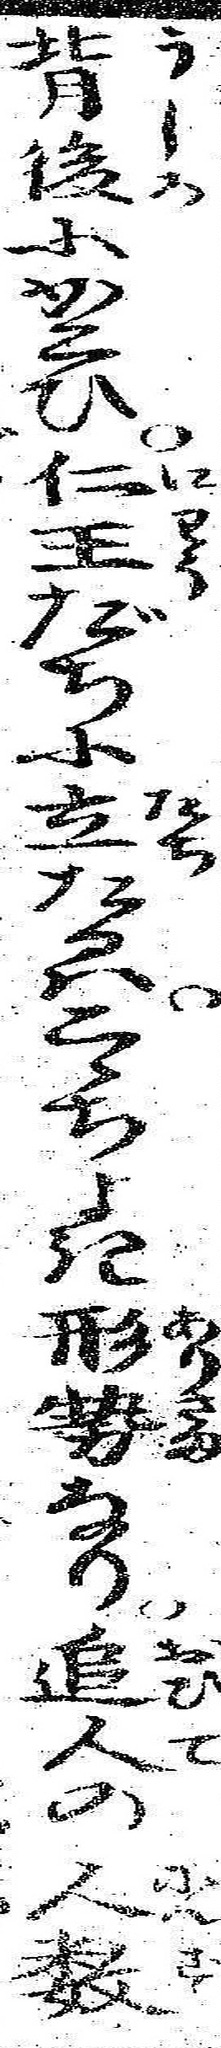背後にかこひ。仁王だちに立たるは。こゝちよき形勢なり。追人の人数
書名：昔話稲妻表紙
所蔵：国文学研究資料館
